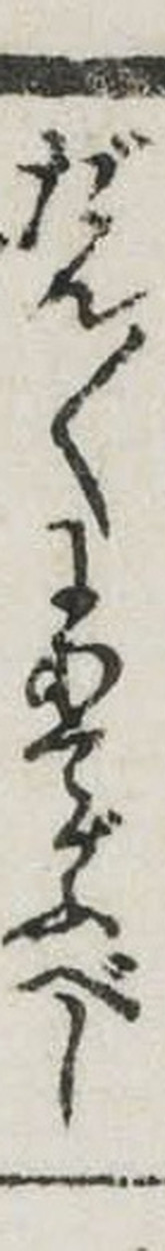だん〳〵にあてがふべし
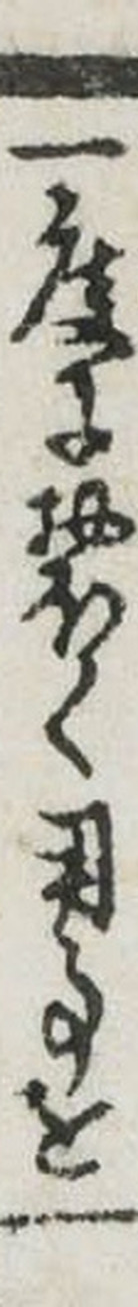一度におほく用事を
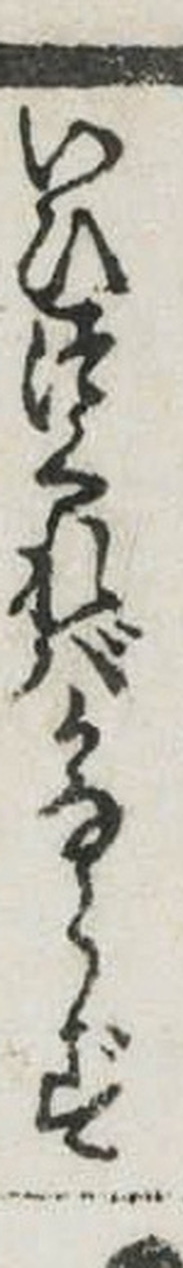いひつくればかならず
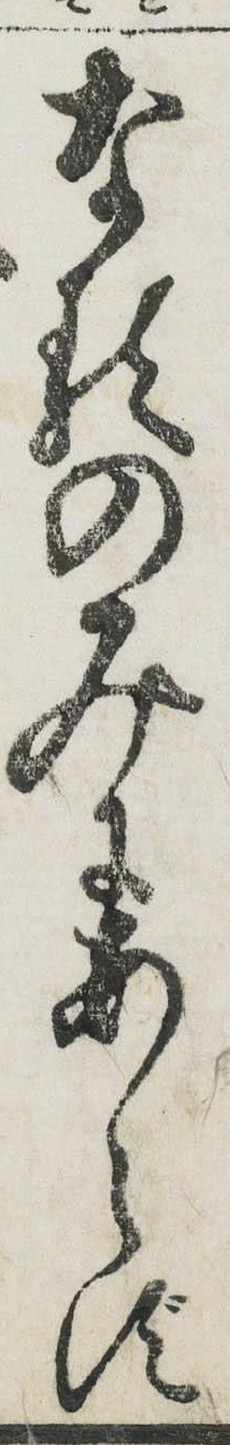なるのみにあらず
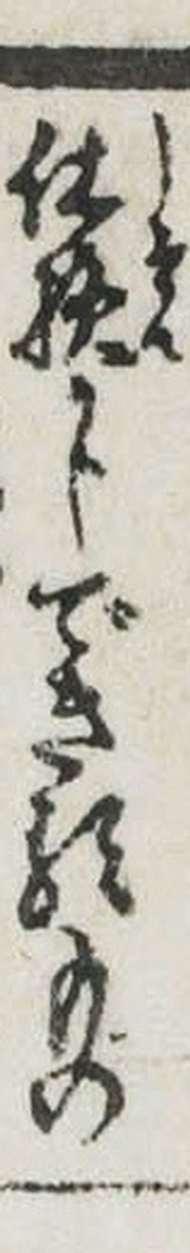仕損じできるもの
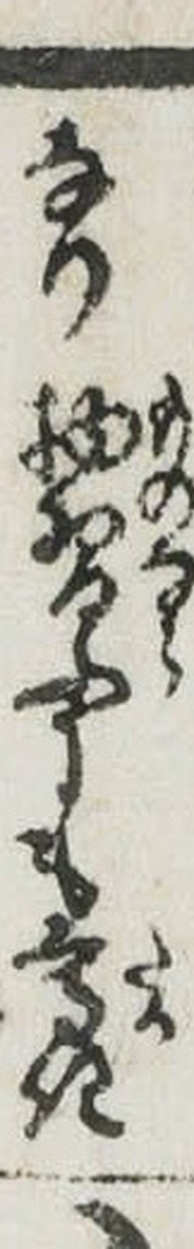なり物習ふにも高き
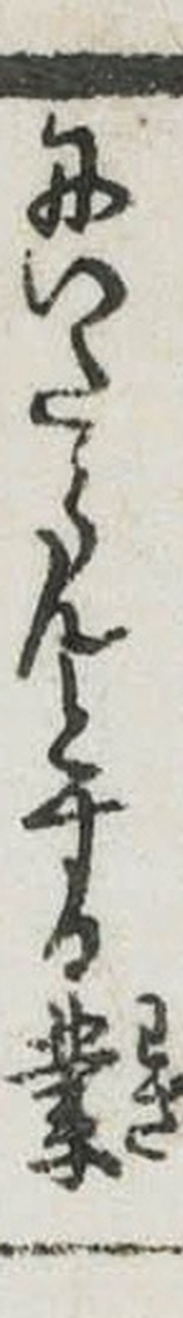にいたらんとする業
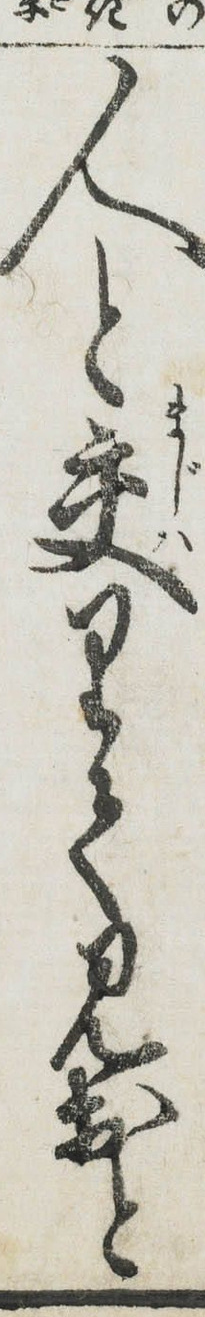人と交りて見おと
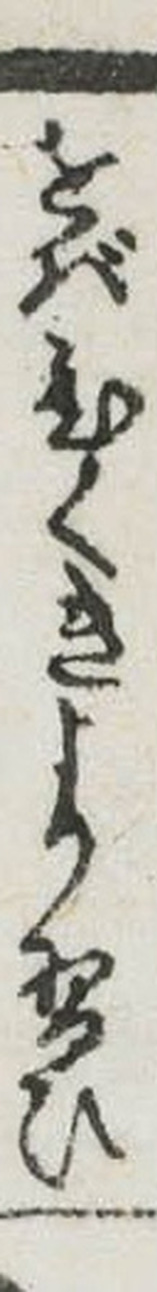をばひくきより習ひ
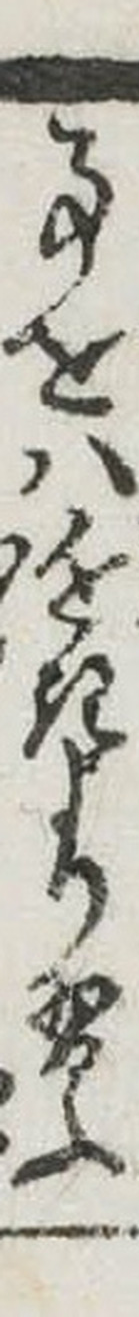事をは近きより習ふ
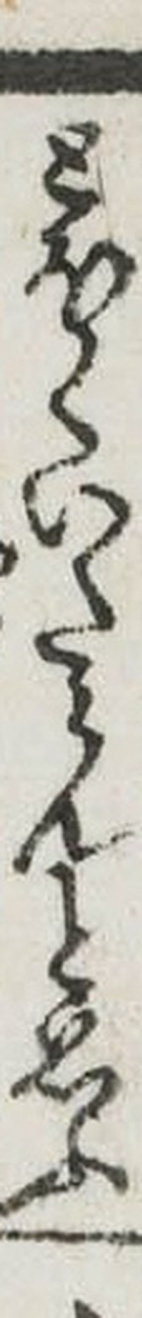とほくいたらんと思ふ
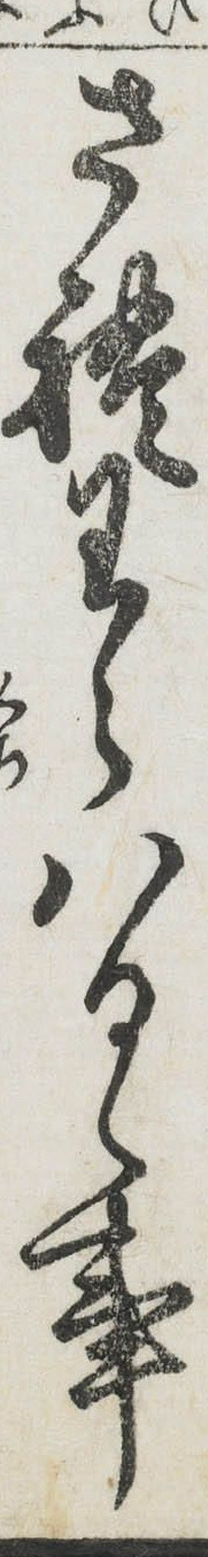されわらはるゝ事
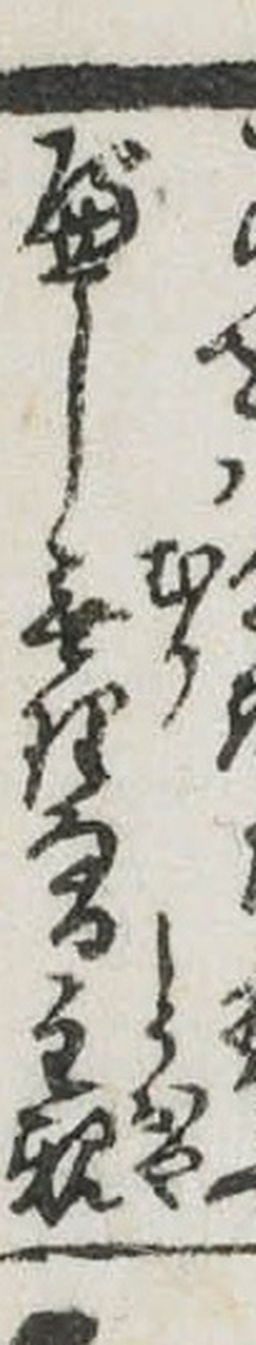べし無理なる主親
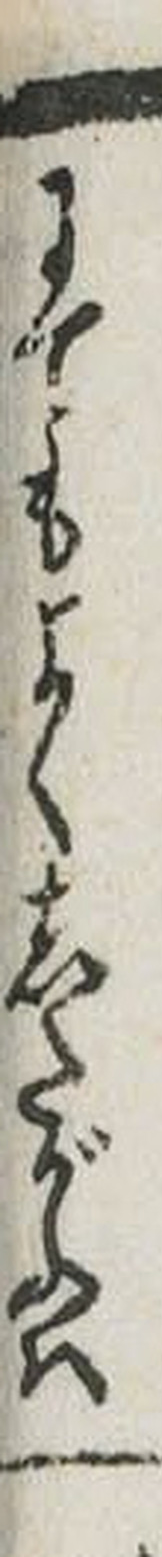にてもよくしたがふは
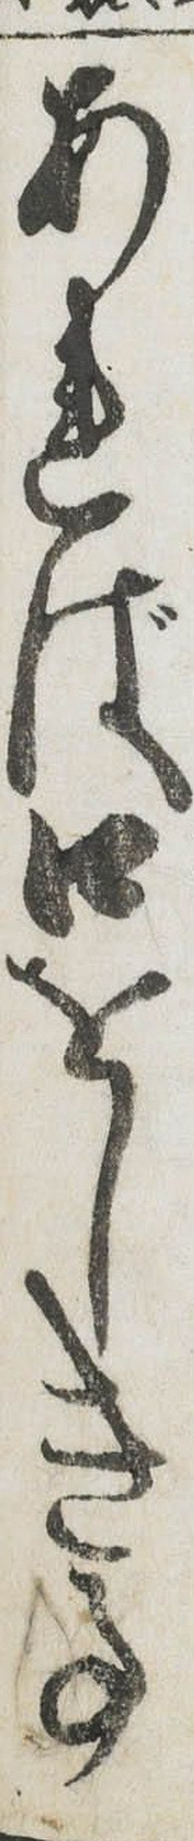あれば口をしき事
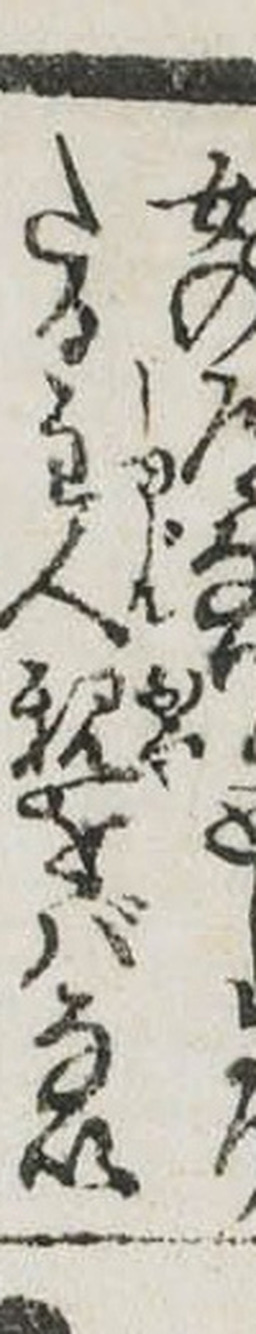たる主人親をばない
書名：頭書萬用婦人手紙之文言
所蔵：東京学芸大学教育コンテンツアーカイブ
